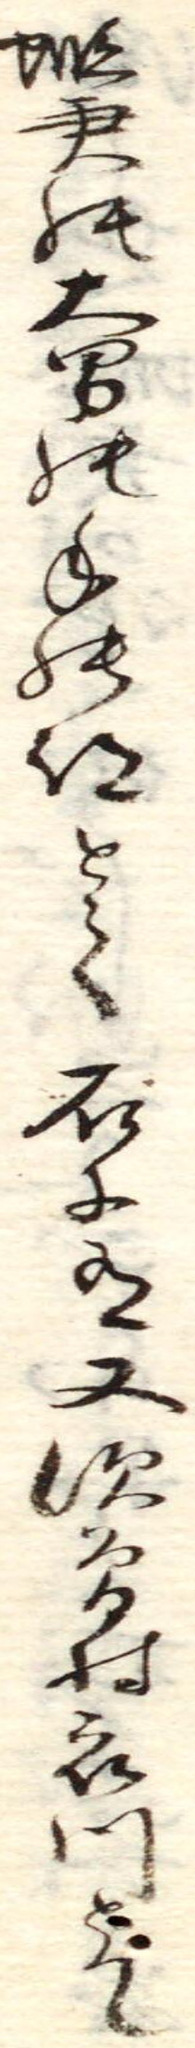蝦夷の大男の手の跡とて石に有又須曽村衣川とて
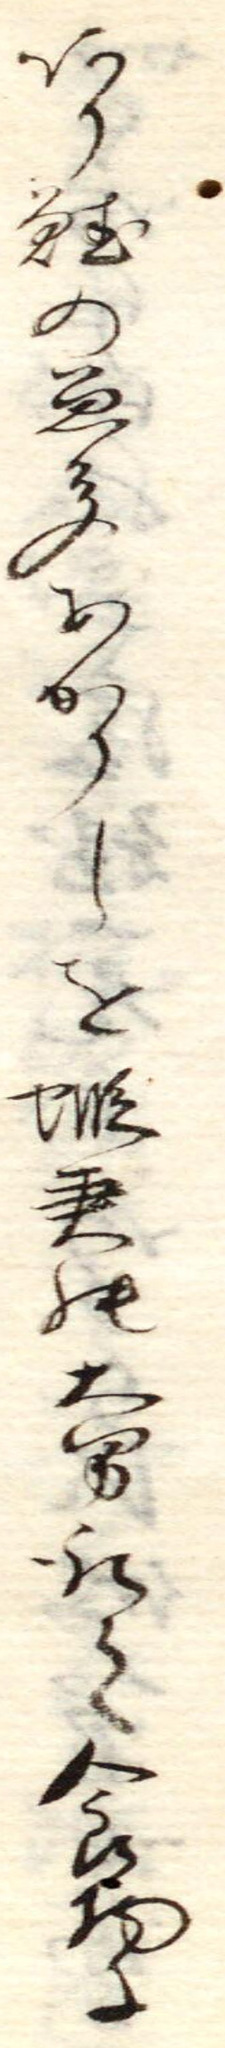あり鮭の魚多あかりしを蝦夷の大男取て食物に
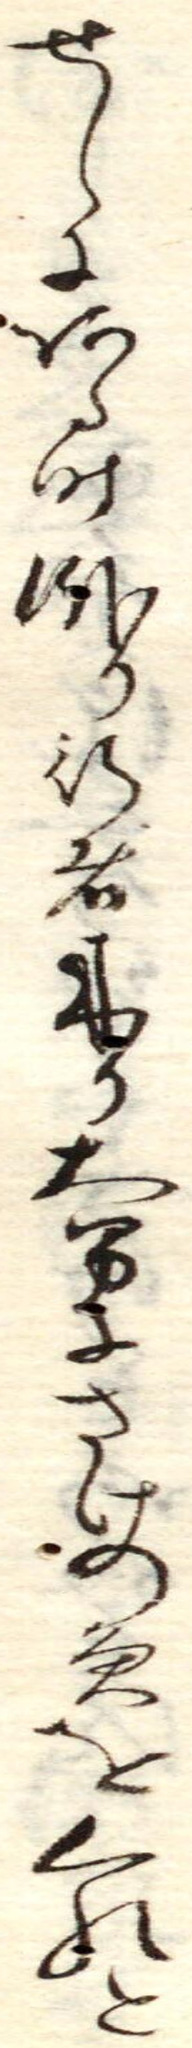せしにある時臥り行者来り大男にさけの魚をくれと
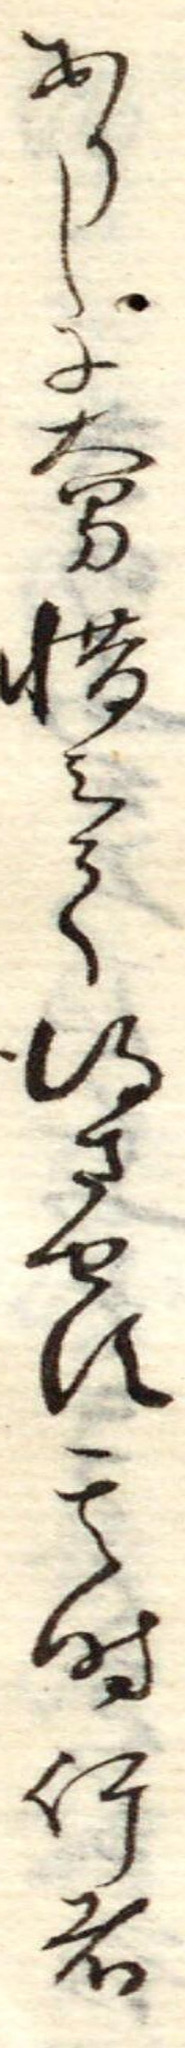ありしに大男惜しみて得させす其時行者

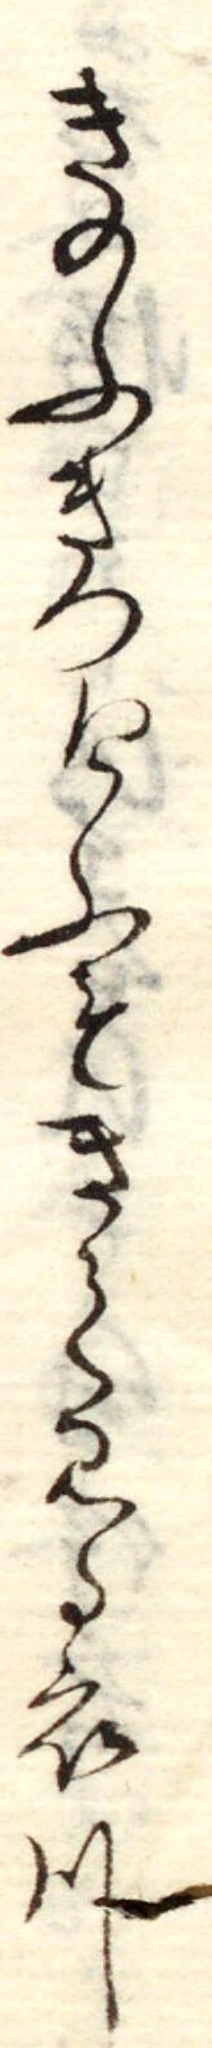きのふきつけふもきてみる衣川
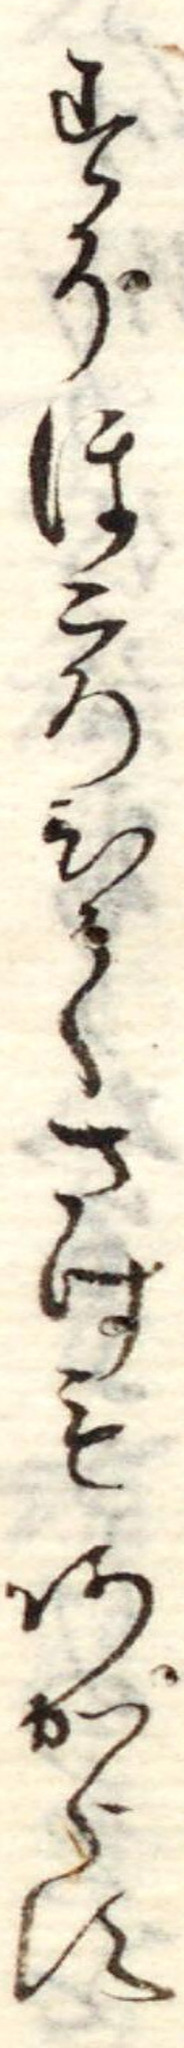すそほころひてさけもあからす
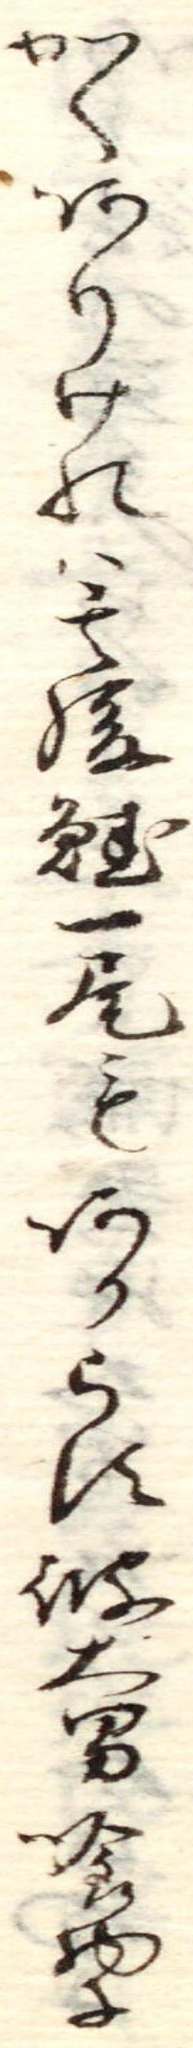かくありけれは其後酒鮭一尾もあからす彼大男喰物に
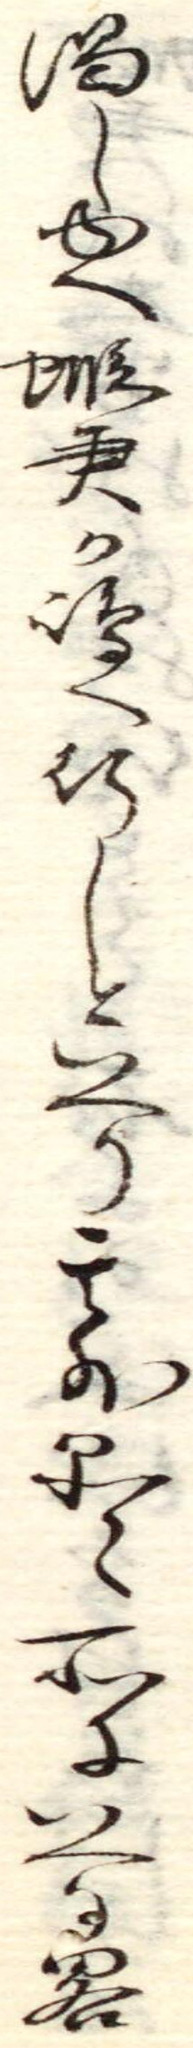喝しゆへ蝦夷か嶋へ行しといへり其外品々所にいへり略
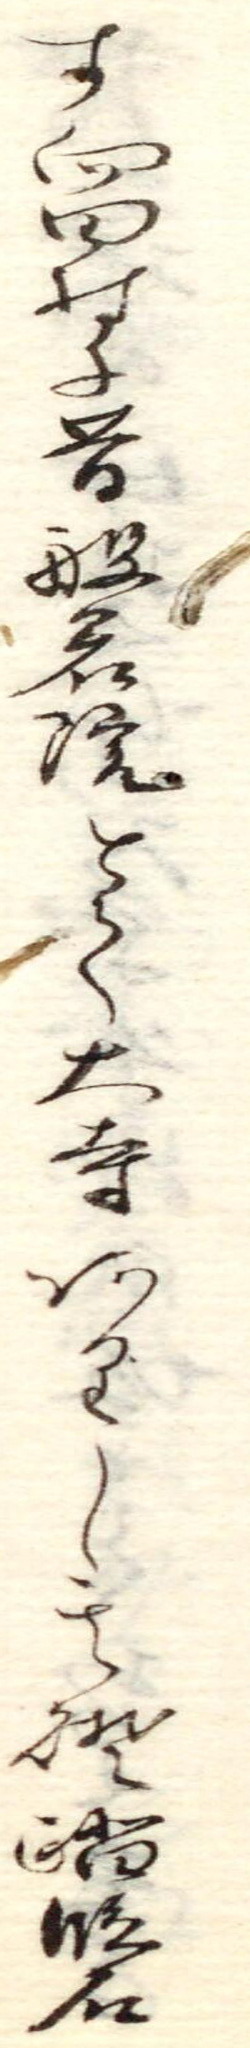す向田村に昔般若院とて大寺ありし其礎踏段石
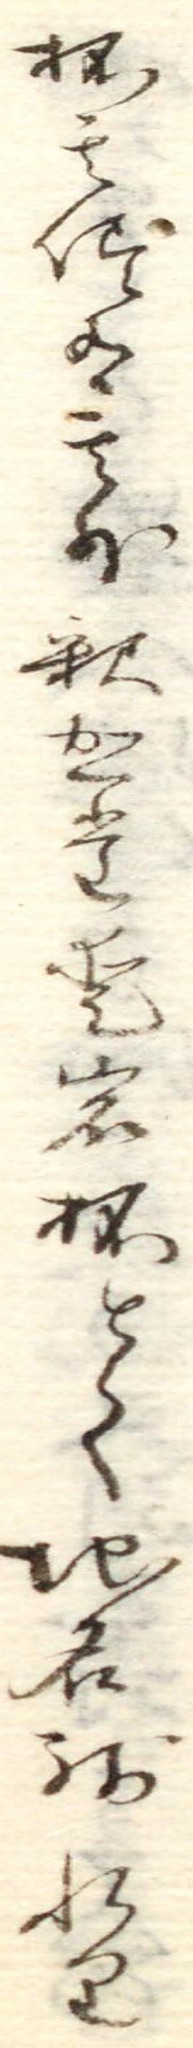抔其侭有其外釈迦堂愛宕抔とて地名残れり
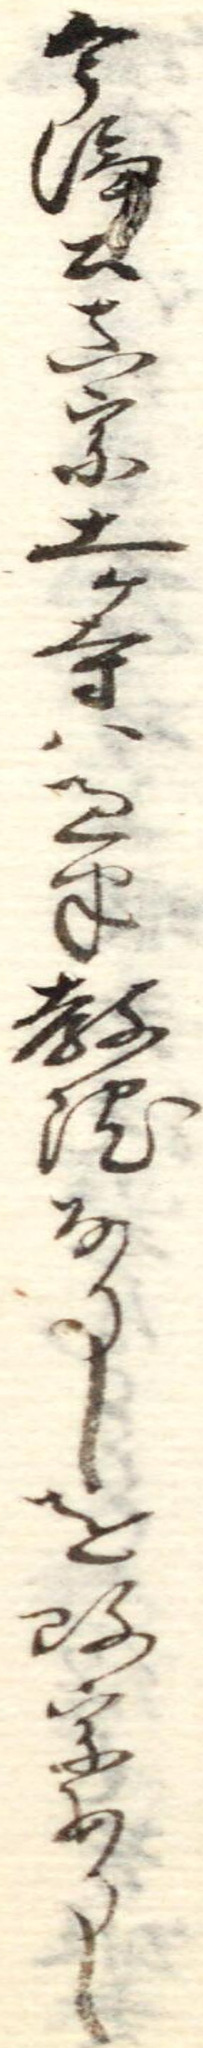今浄土真宗十一ヶ寺は過半教院なりしを改宗ありし
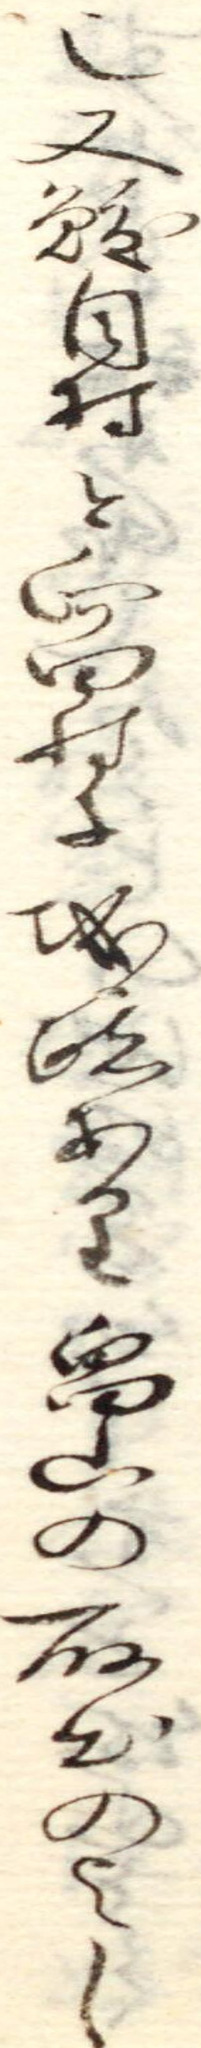也又鰀目村と向田村に城跡あり畠山の取出ｎのよし
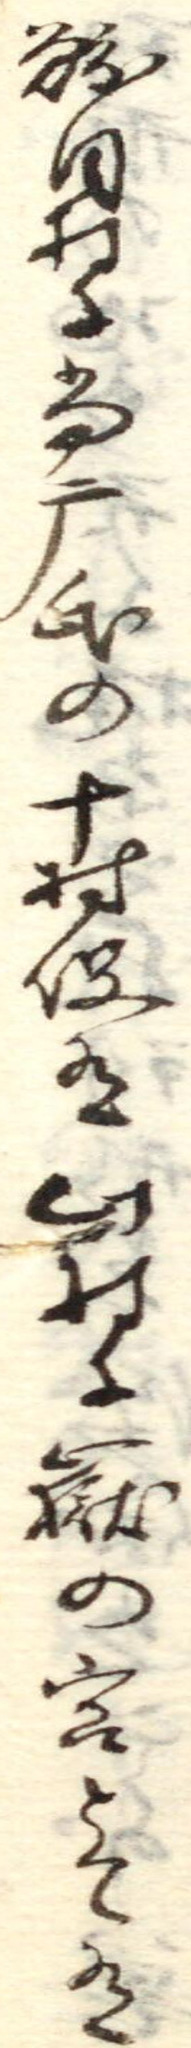鰀目村に当麻氏の十村役有此村に嶽の宮とて有
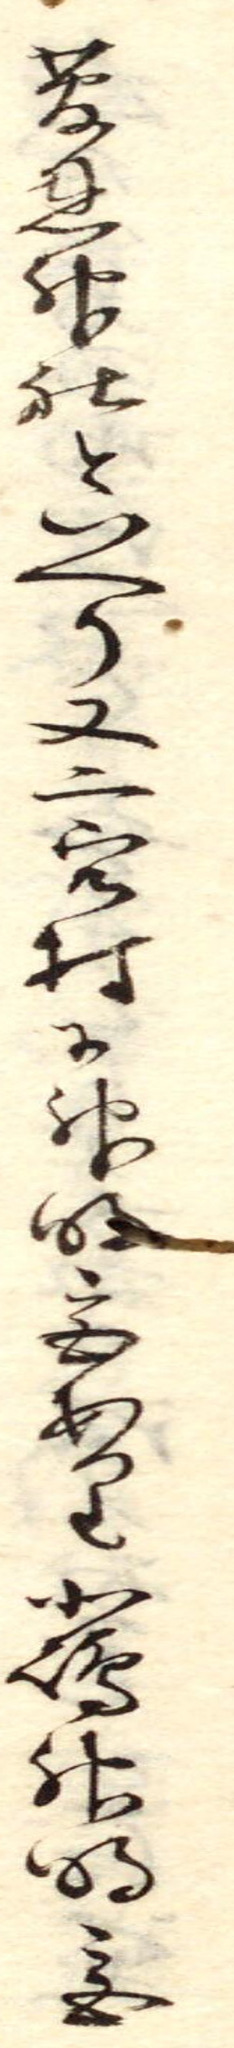菅忍神社といへり又二穴村に神明宮あり北嶋神明宮
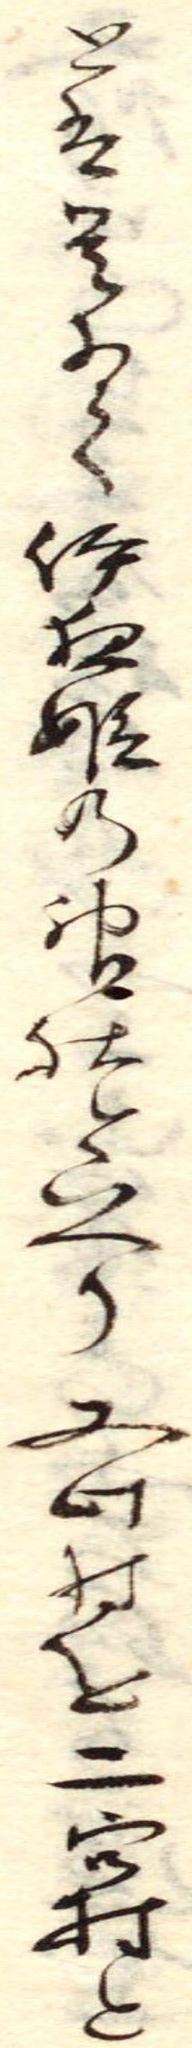とは是にて伊夜姫の神社といへり又此村を二穴村と
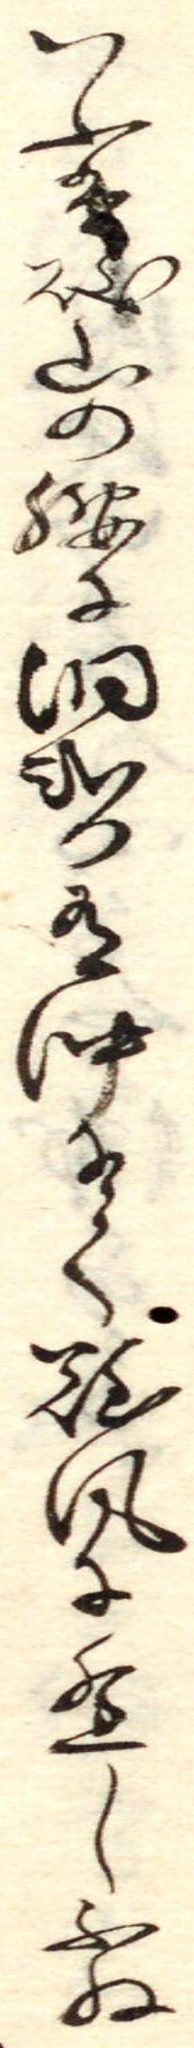いふは礒山の腰に洞弐つ有沖にて難風に逢しふね
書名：能登名跡誌
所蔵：Ishikawa Prefectural Library
